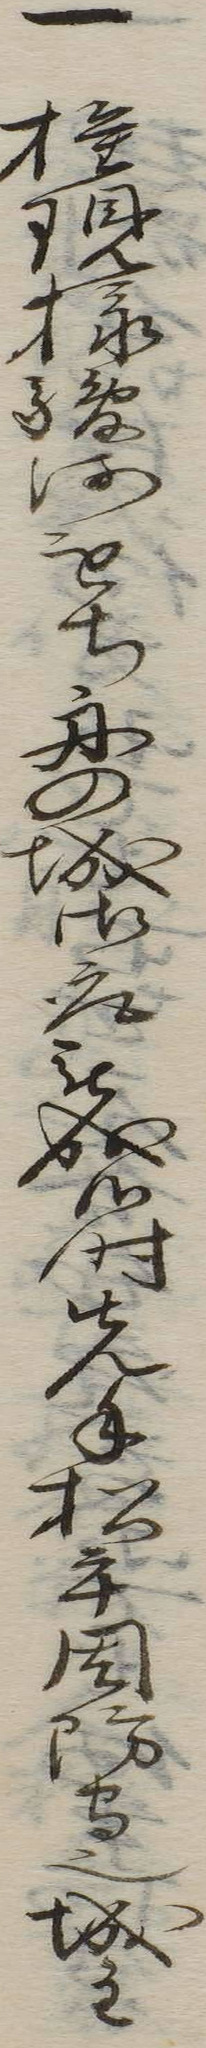一権現様駿河もち舟の城御取被成候時先手松平周防守也城主
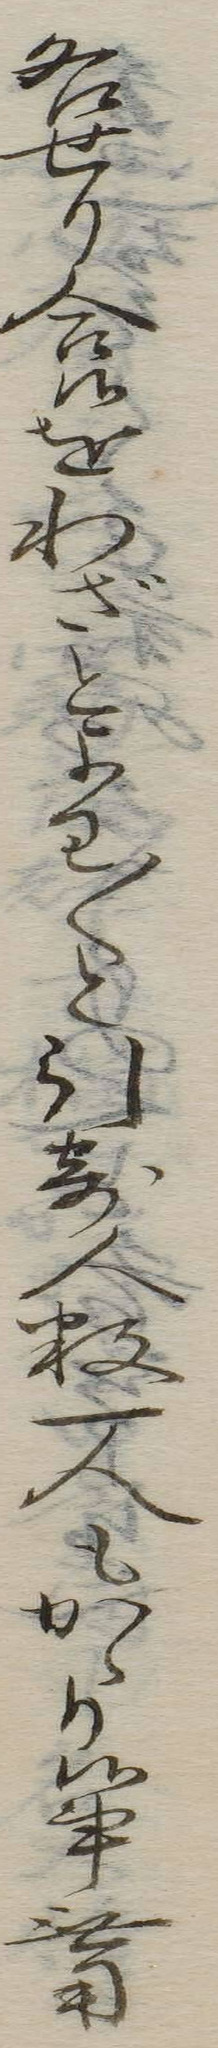各せり合候をわざとよわ〳〵と引寄人数一人もかゝり候事無用
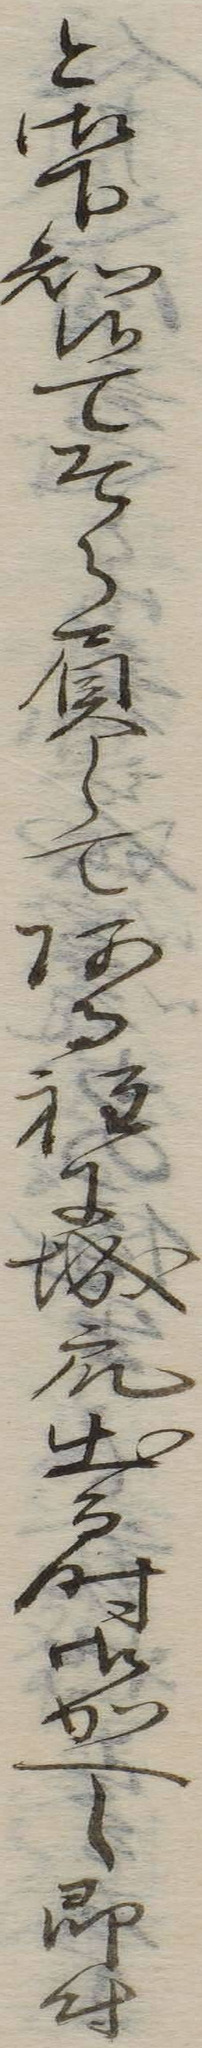と御下知候てそら負してある程に城衆出る時御かへし即付
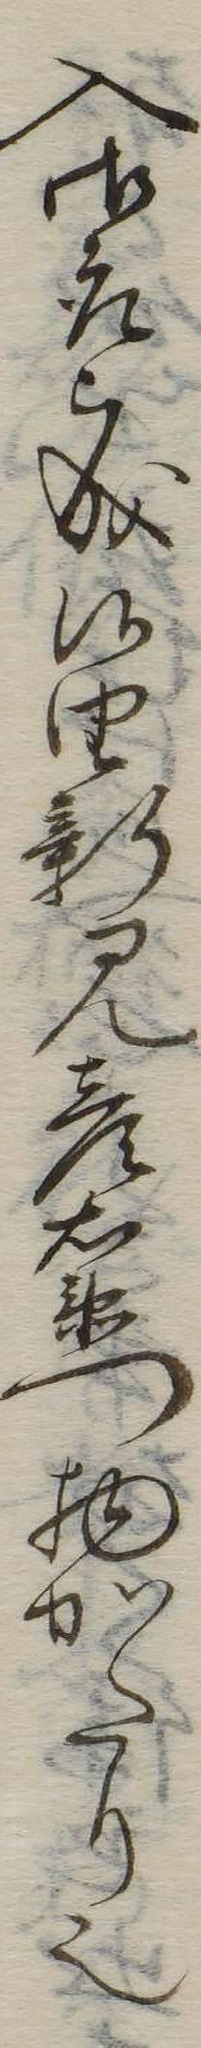入御取被成候由新見彦右衛門物かたり也
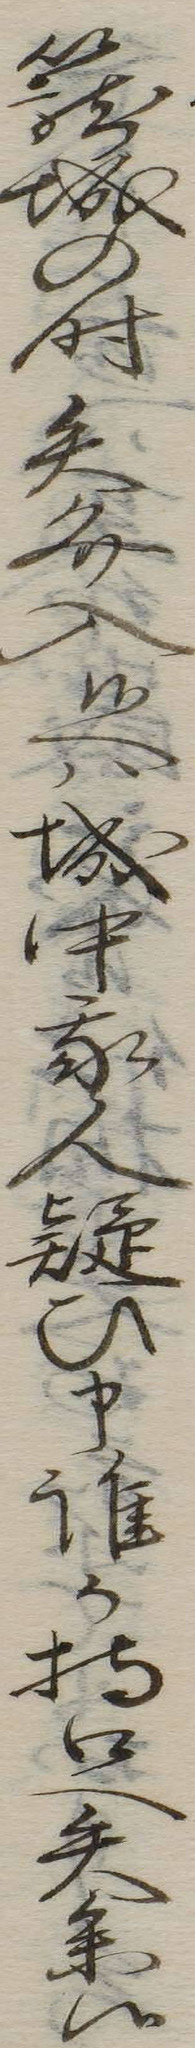一籠城の時矢文入候へは城中家人疑ひ申誰か持口へ矢集候
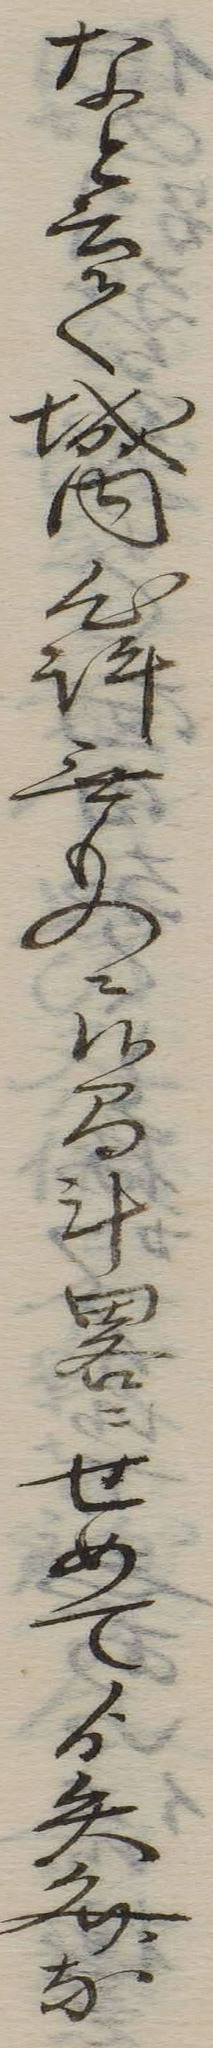なと云て城内心許無ものに候間計略にせめてより矢文な
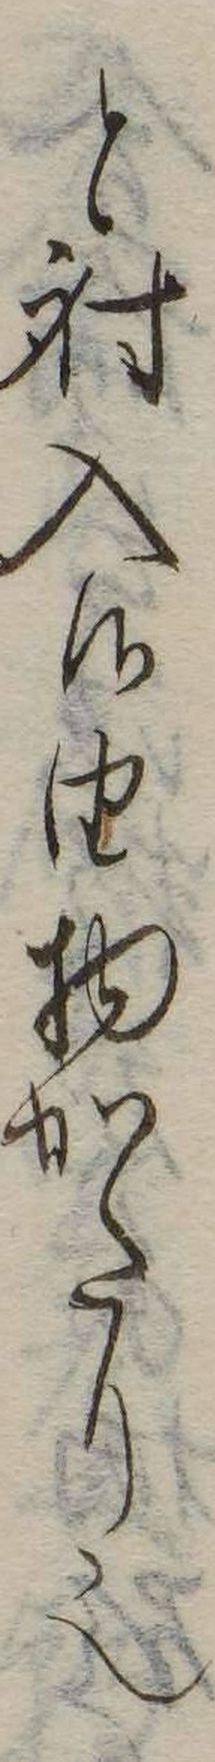と射入候由物かたり也
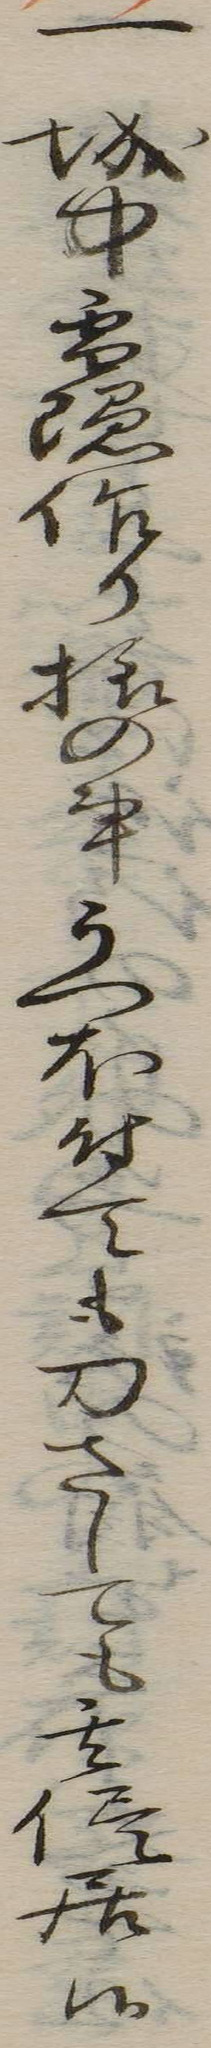一城中雪隠作り様の事うつほ付ても刀さしても其儘居候
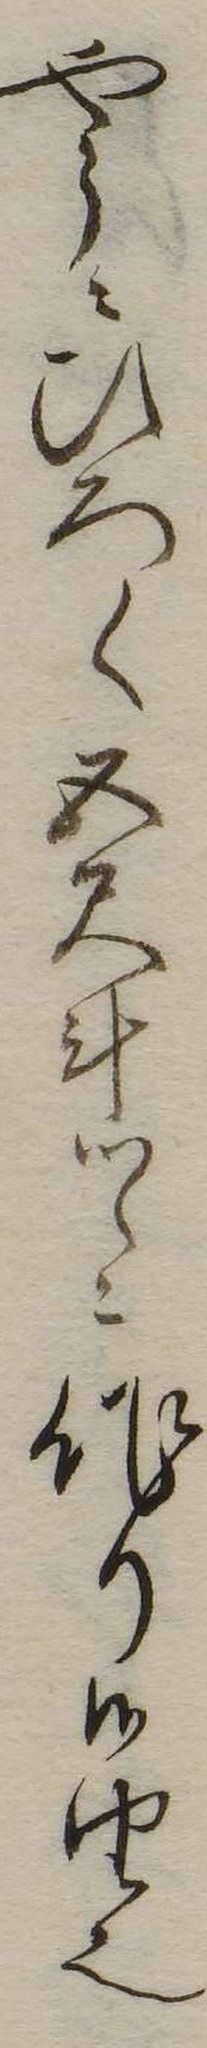やうにひろく五尺斗つゝに作り候由也
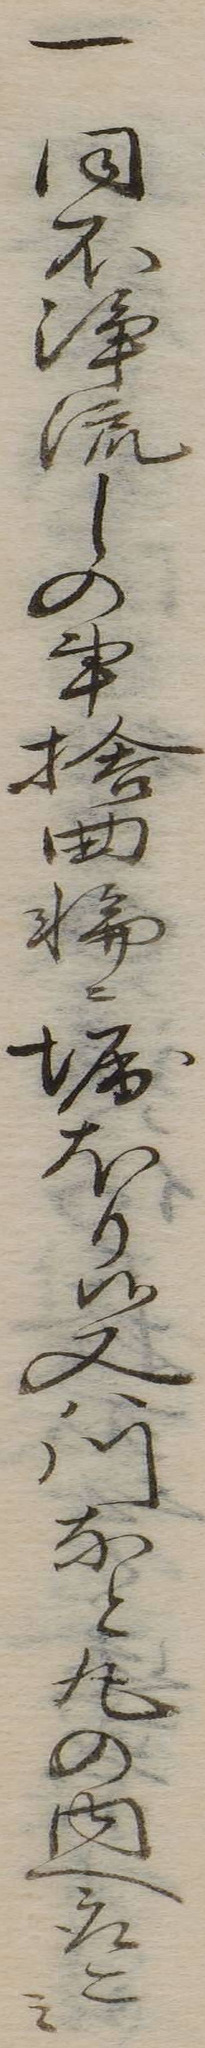一同不浄流しの事捨曲輪に堀ほり候又は川なと丸の内へ取こみ

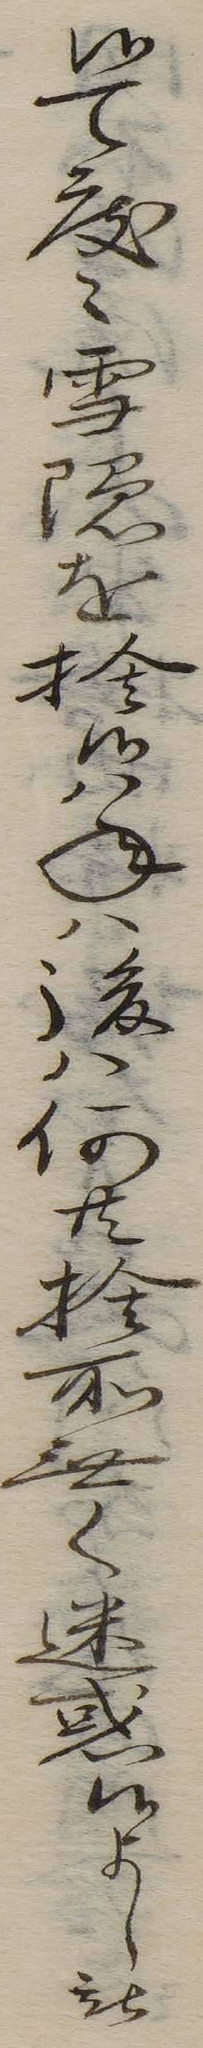候て度々雪隠を捨候はねは後は何共捨所無く迷惑候よし被
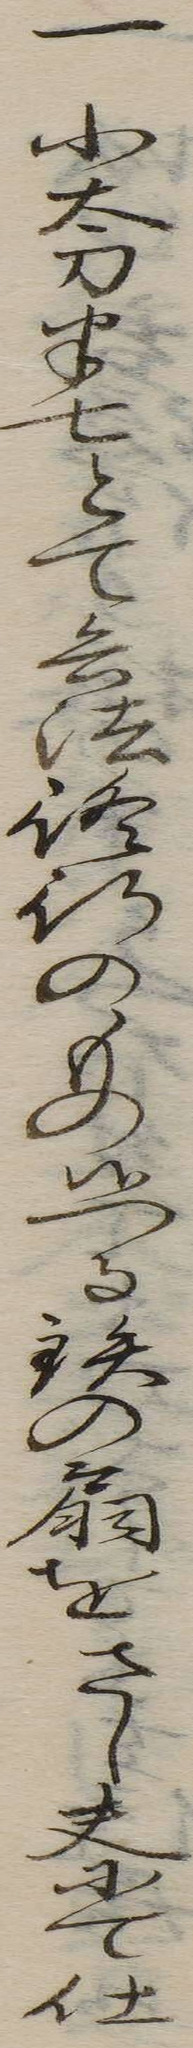一小太刀半七とて兵法修行のもの候つる鉄の扇をさし夫にて仕
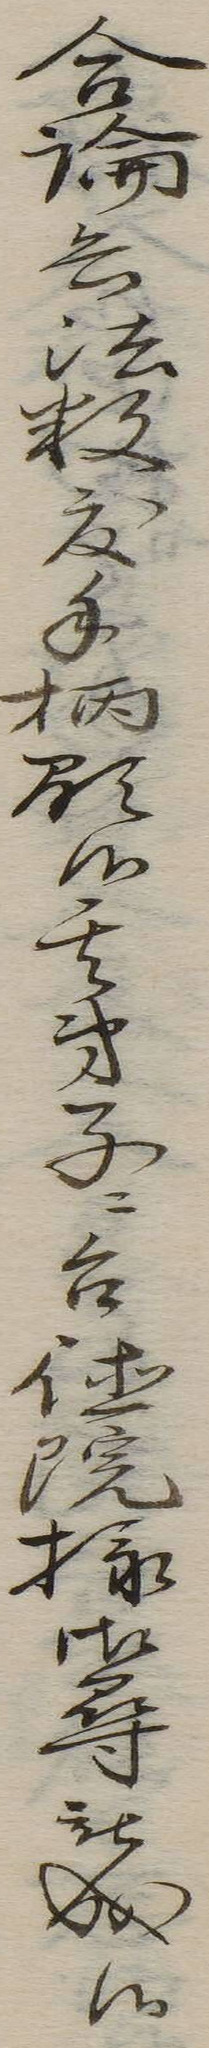合論兵法数度手柄顕候其弟子ニ台徳院様御尋被成候
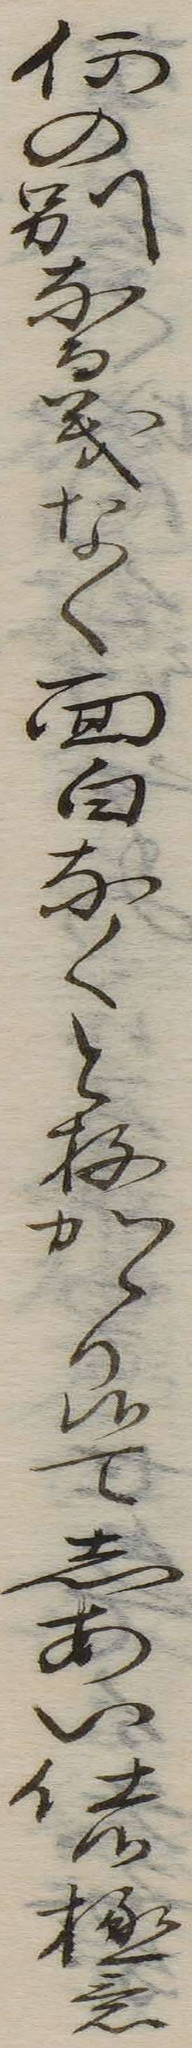何の別なる義なく面白なくとしと存かゝり候てしあい仕候極意
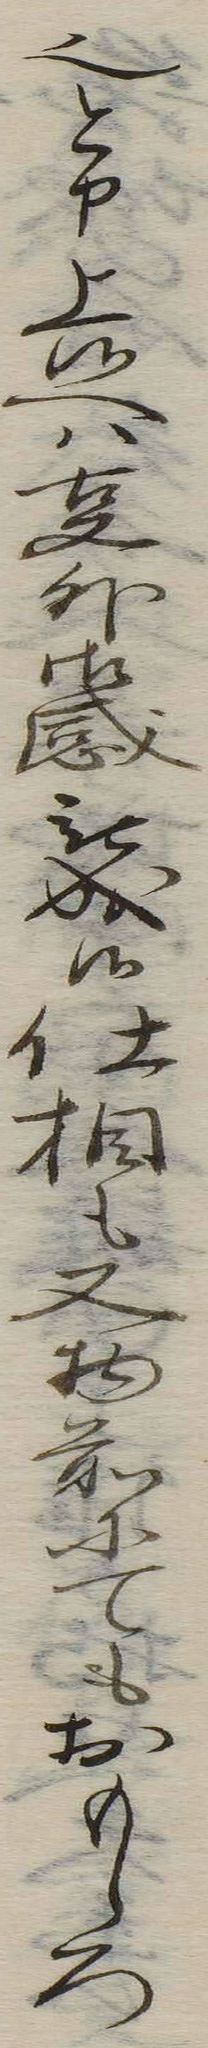也と申上候へは事外御感被成候仕相も又物前にてもおもしろ
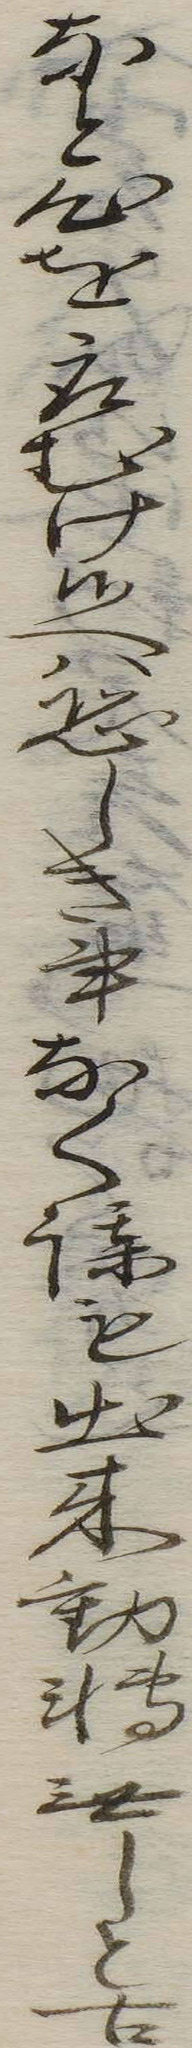なと心を取むけ候へは恐しき事なく謀も出来動転無しと古
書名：三河之物語
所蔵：国文学研究資料館
